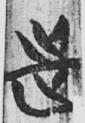○（止）
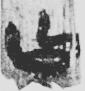曰
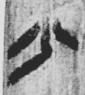少（小）
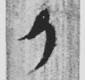人
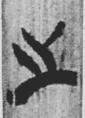之
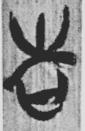告
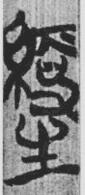{糸灭口又生}
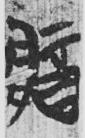𨟻（將）
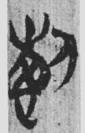{叀刀}（斷）
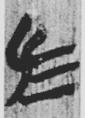於
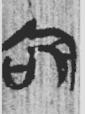含（今）
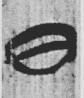日
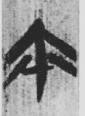尔
